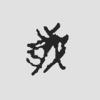歲
